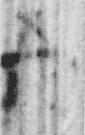之
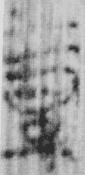豊（禮）
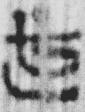必
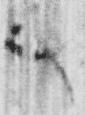又（有）
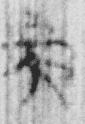夫
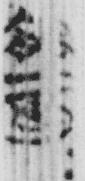臍臍
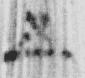之
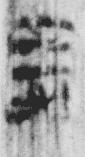敬
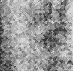居
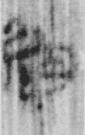居
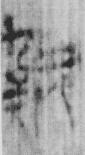桑（喪）
